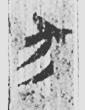方
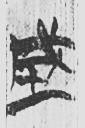城
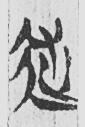述
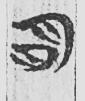明
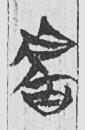者
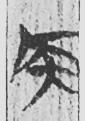侯
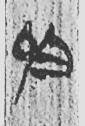於
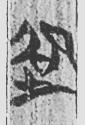{召卩土}
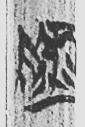陵
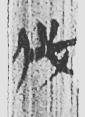伐
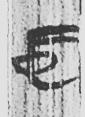𠁩
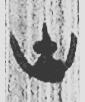山
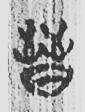晉
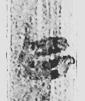𠂤
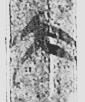大
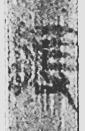疫
